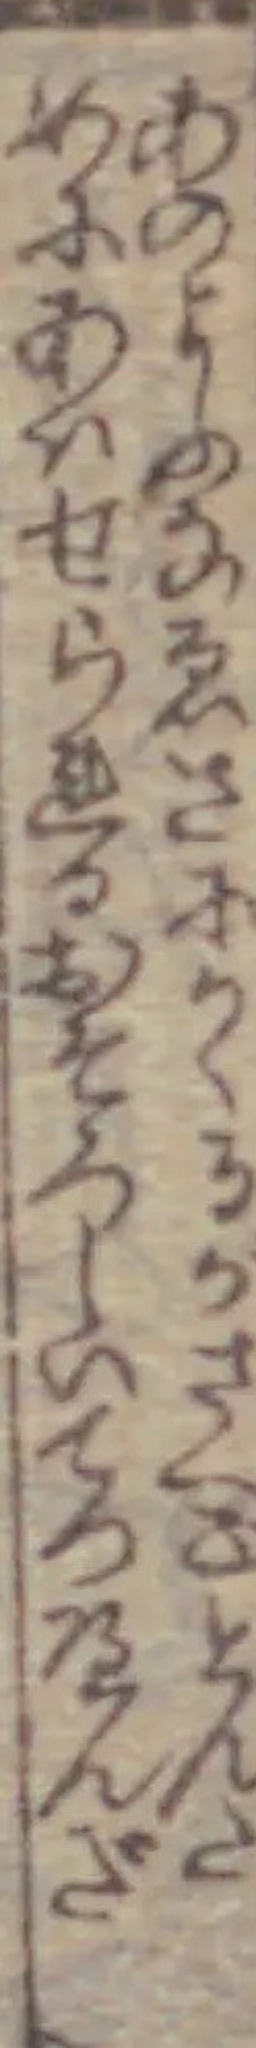めにあはせられるおそろしいてつへんだ
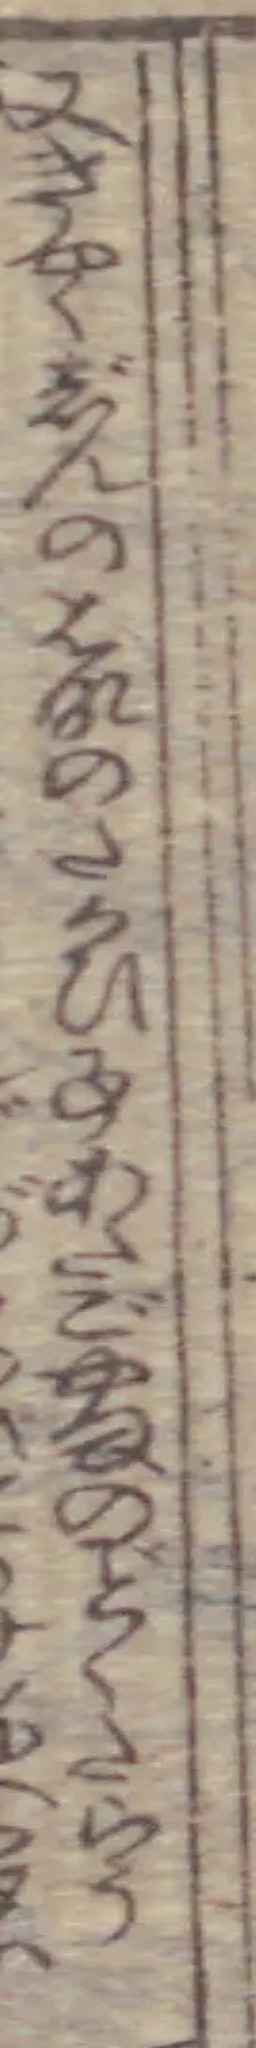又きやくじんのはなのたかひ事あたごやまのごとくたらう
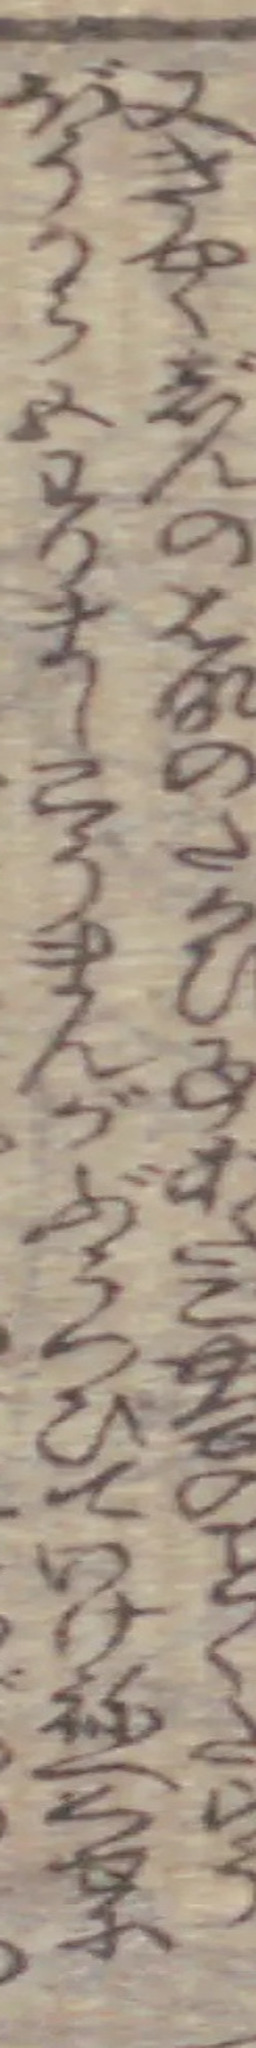ぼうから五わりましこうまんがぶらついていけねへくせに
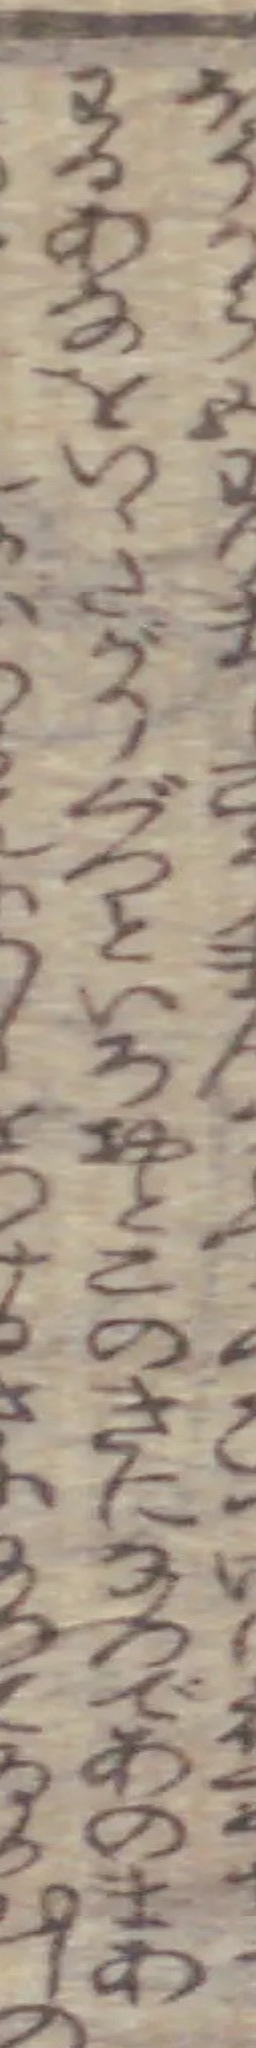わるあなをいゝたがりぐつといろおとこのきになつであのまあ
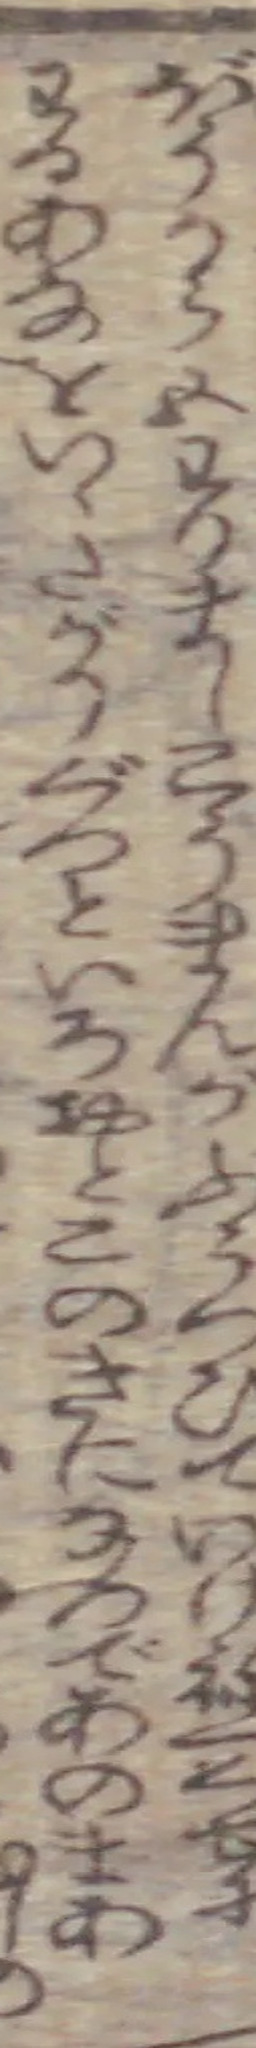わるあなをいゝたがりぐつといろおとこのきになつであのまあ
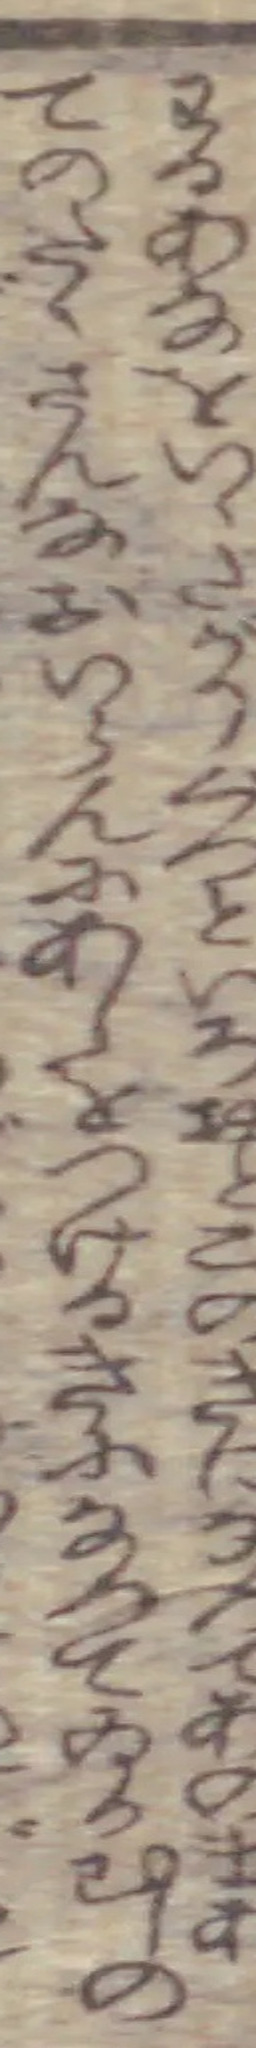てのたくさんなおいらんにあしをつけるきになつてゐるむしの
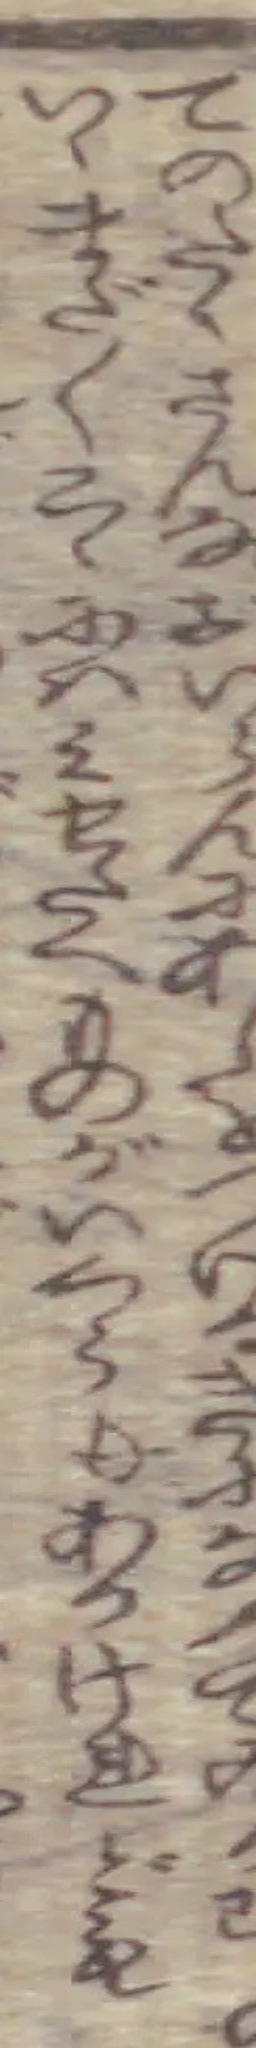いゝまだ〳〵こゝにはみせたへものがいくらもあるけれども
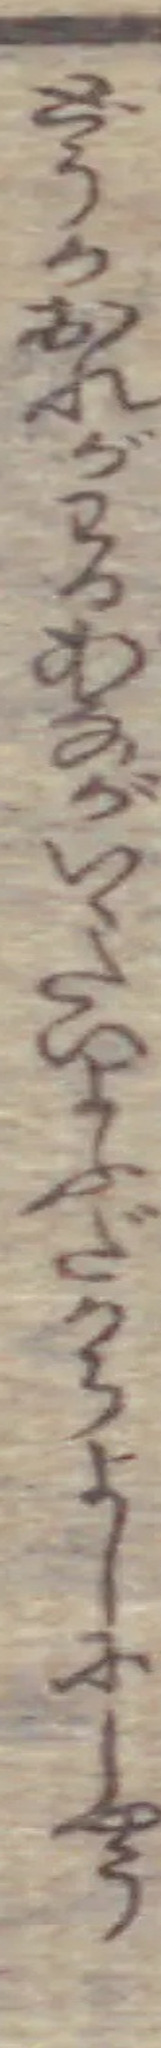どうかおれがわるあながいゝたいよふだからよしにしやう
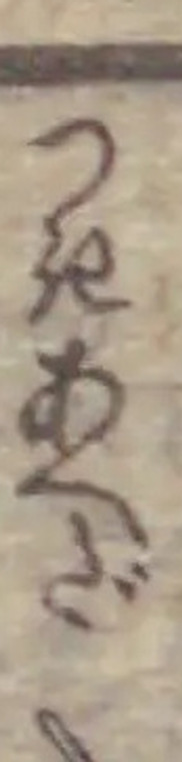つきあへだ

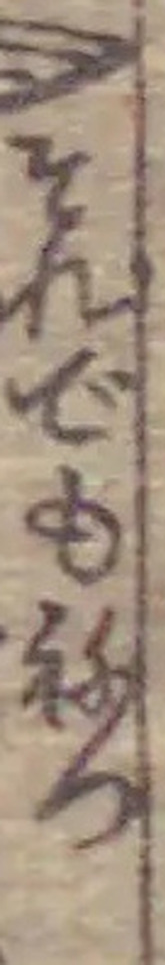それでもねつ
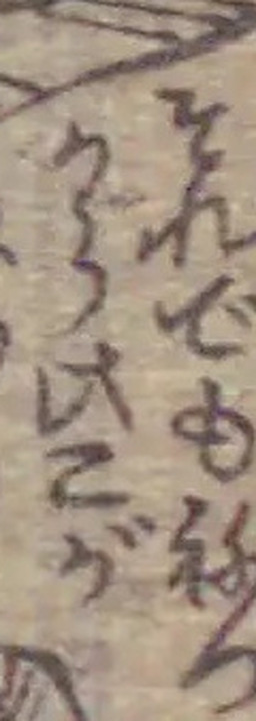から此こが
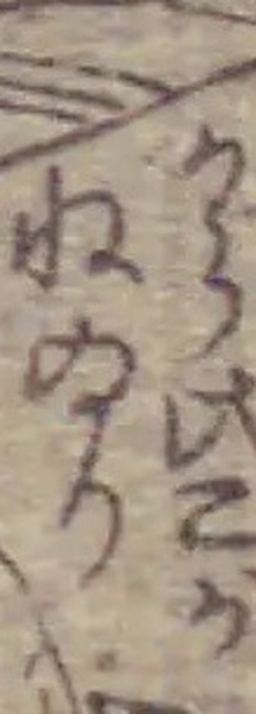ねゐり
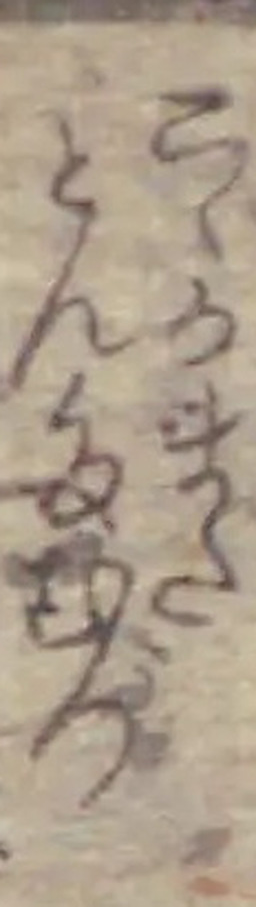とんたむつ
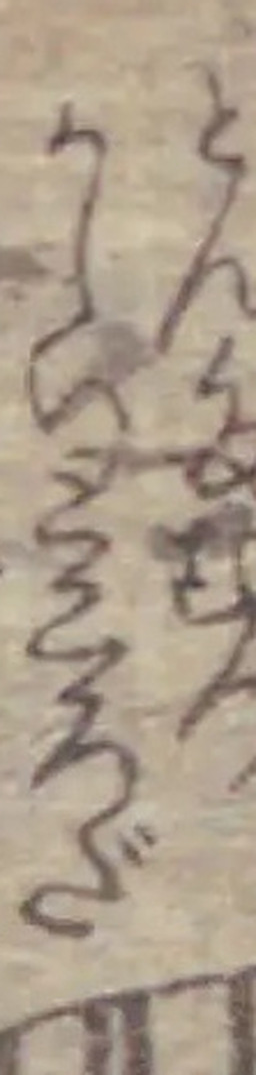かしいところだ
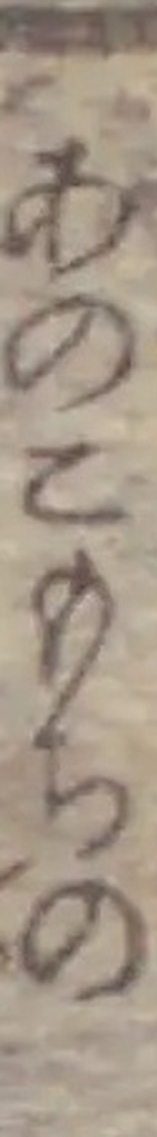あのこもちの
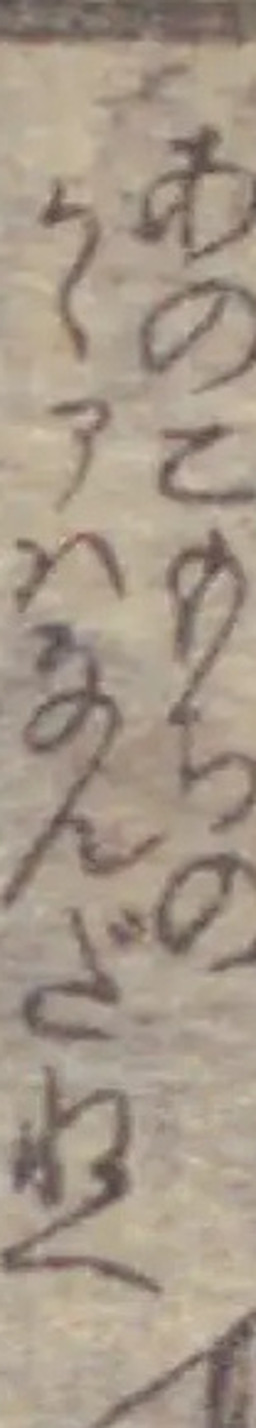かゝアはなんだねへ
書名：化物大閉口 2巻
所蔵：国立国会図書館 National Diet Library, JAPAN
